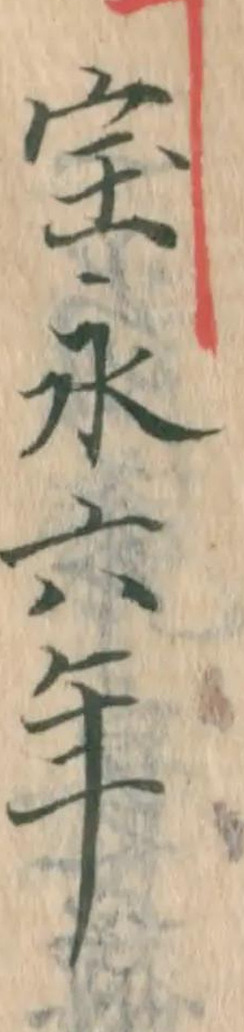宝永六年
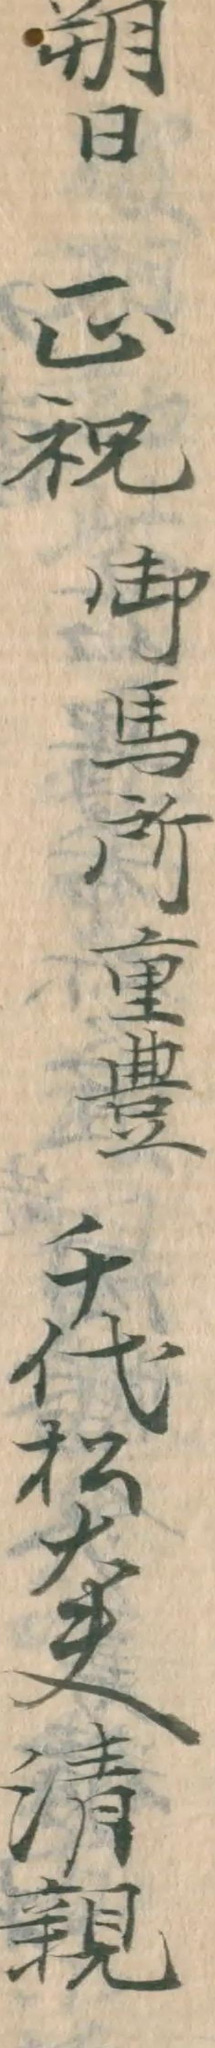朔日正祝御馬所重豊千代松大夫清親

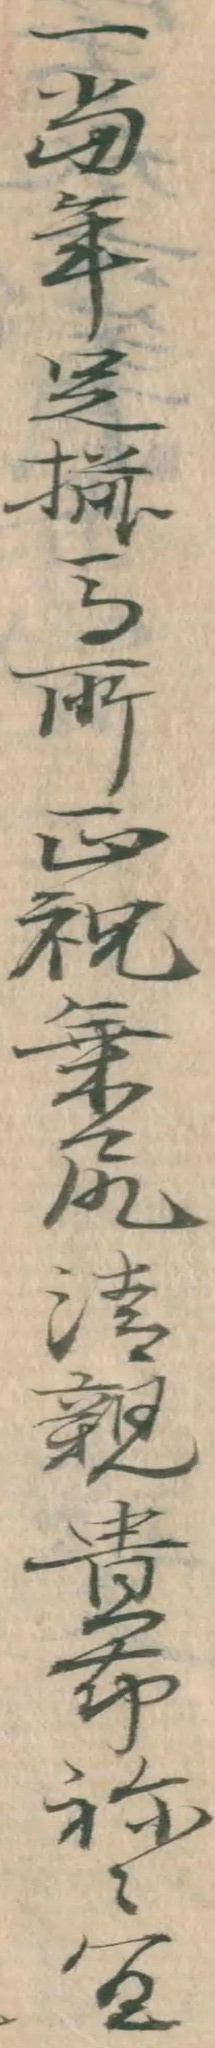一当年足揃馬所正祝乗尻清親貴布祢々宜
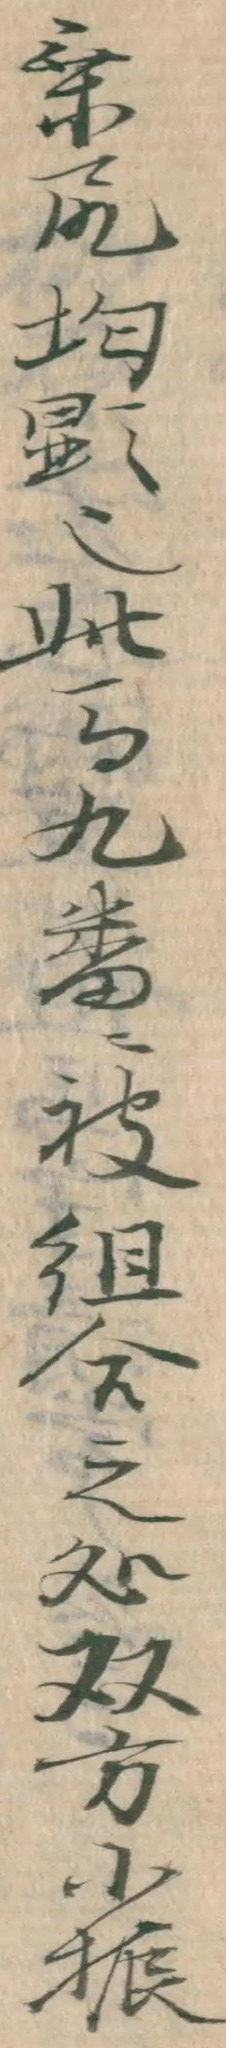乗尻均顕也此馬九番ニ被組合之処双方小振
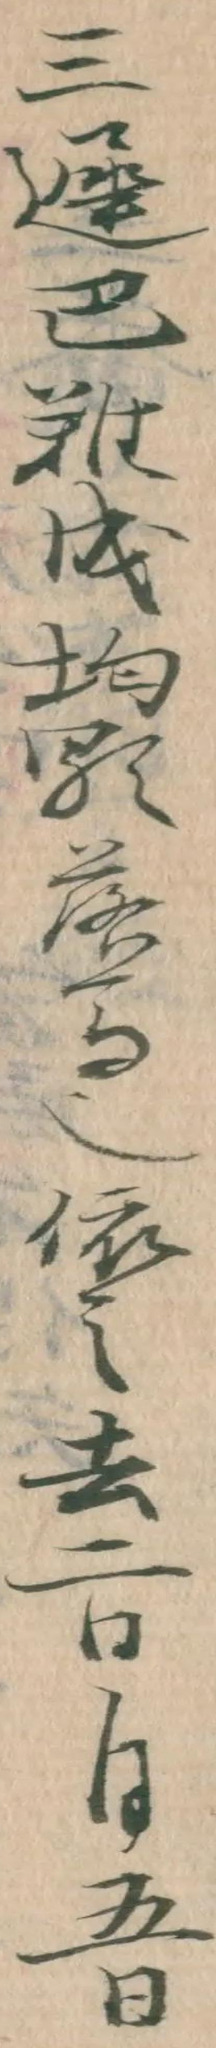三遅巴難成均顕落馬也依之去二日自五日
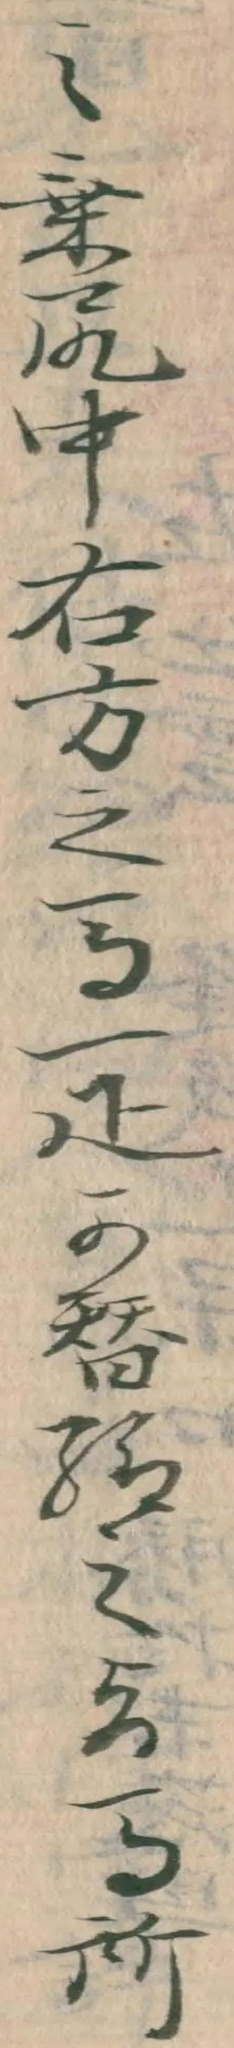之乗尻中右方之馬一疋可替給之旨馬所
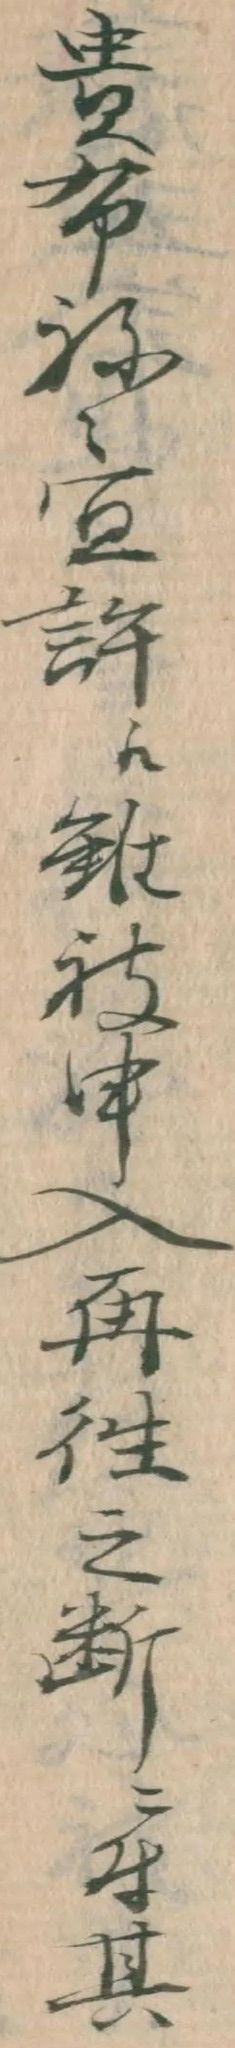貴布祢々宜許江雖被申入再往之断ニ付其
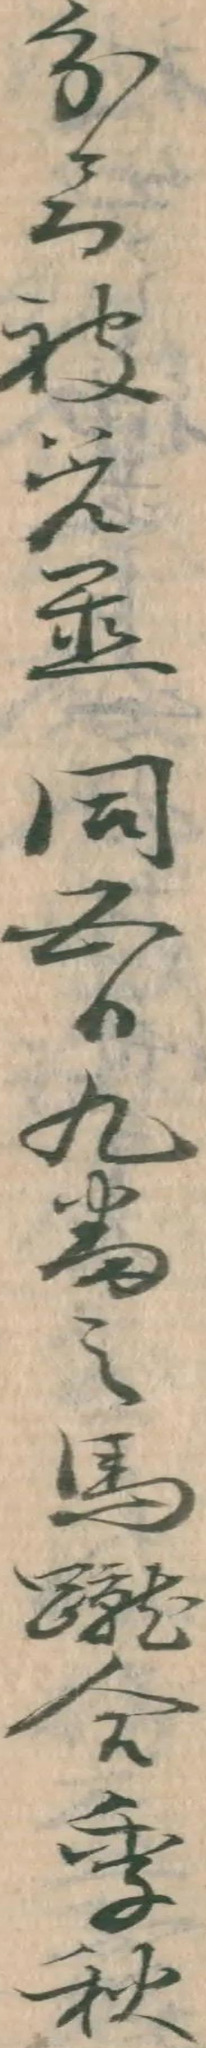分ニ而被差置同五日九番之馬蹴合季秋
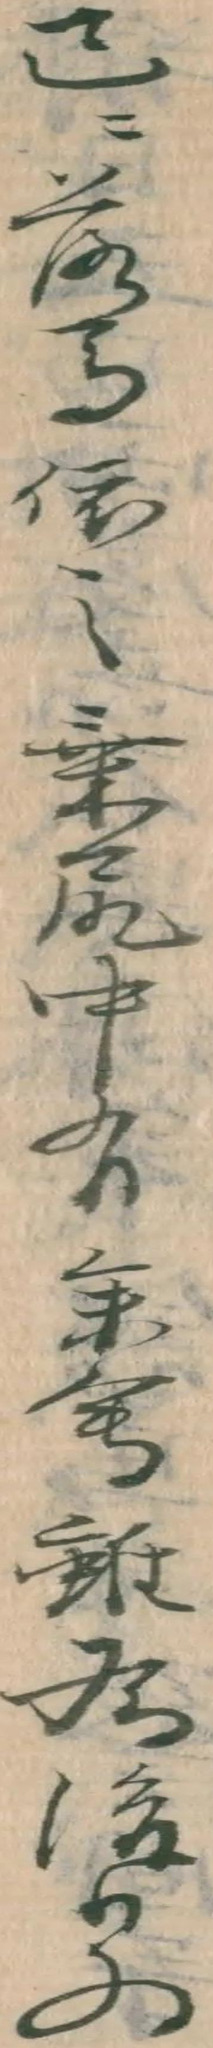已ニ落馬依之乗尻中有参会雖為後日為
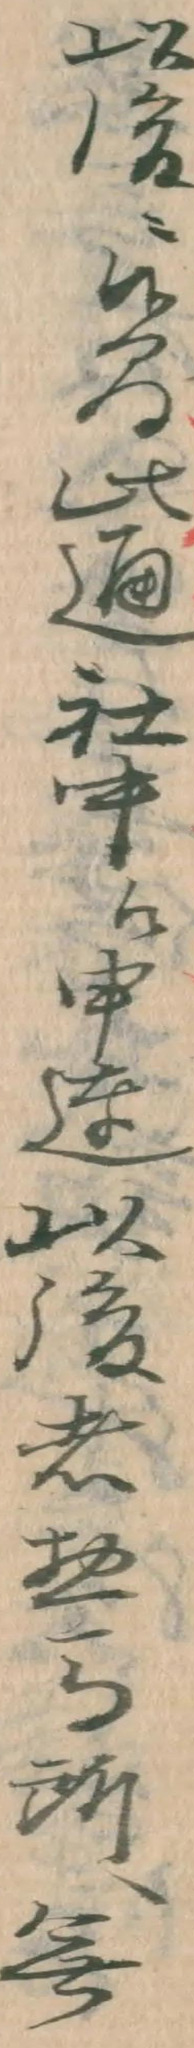以後ニ候間此通社中江申達以後者惣馬所へ無
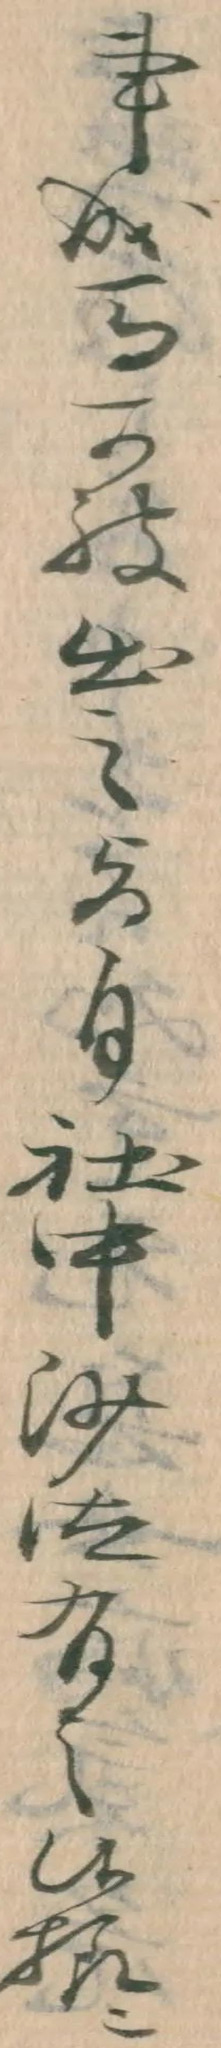事成馬可致出之旨自社中沙汰有之候様ニ
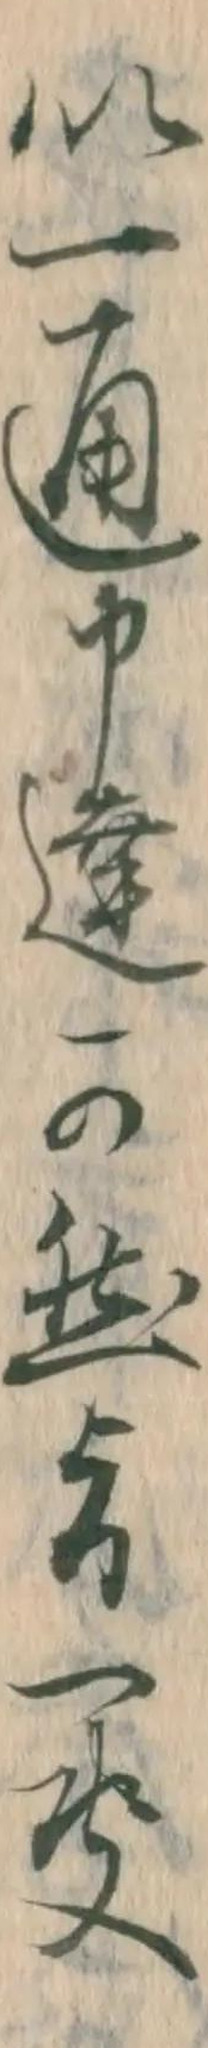以一通申達可然旨一決
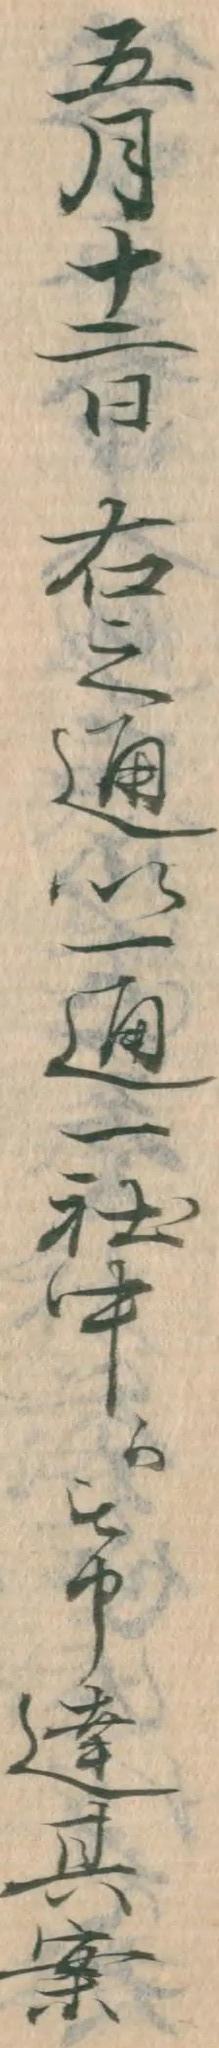五月十二日右之通以一通一社中江被申達其案
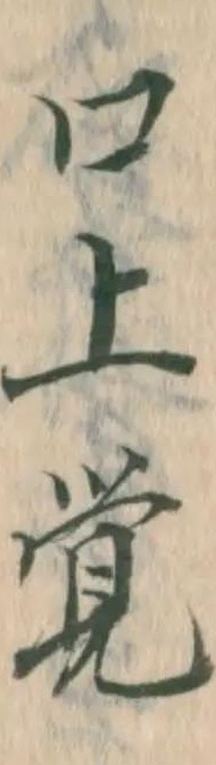口上覚
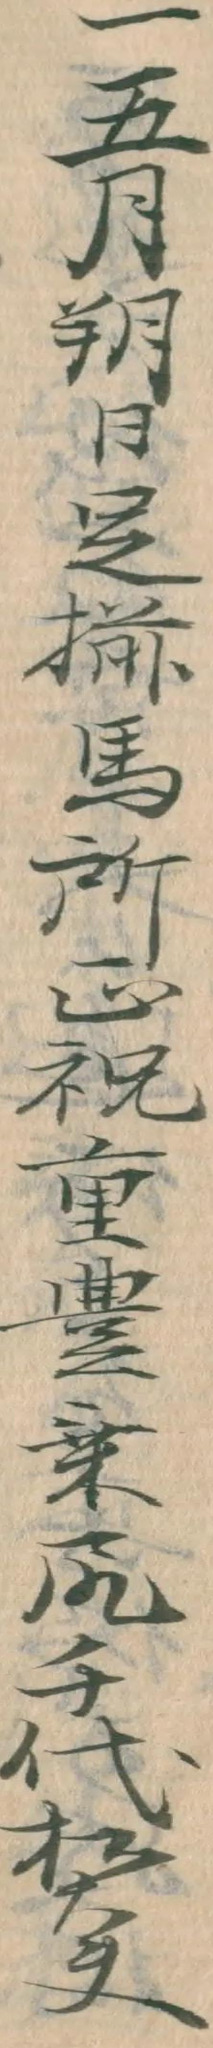一五月朔日足揃馬所正祝重豊乗尻千代松大夫
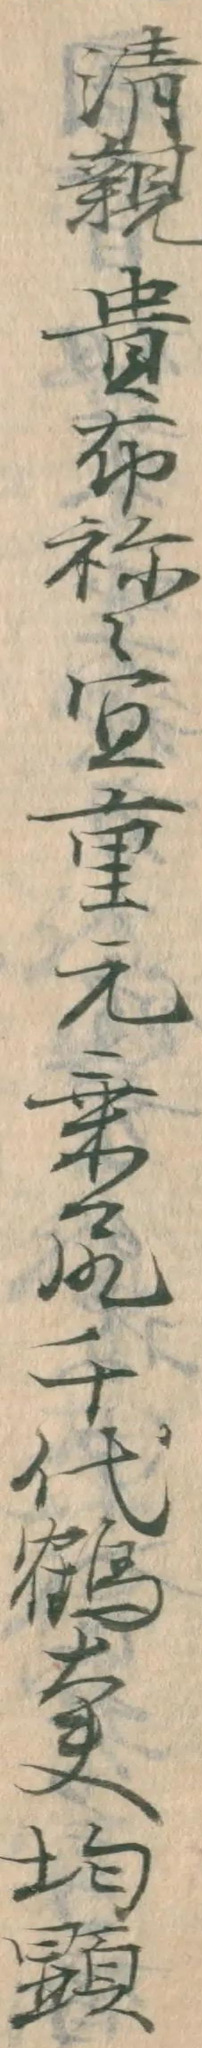清親貴布祢々宜重元乗尻千代鶴大夫均顕
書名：賀茂社記録. 第10冊
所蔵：国立国会図書館 National Diet Library, JAPAN
